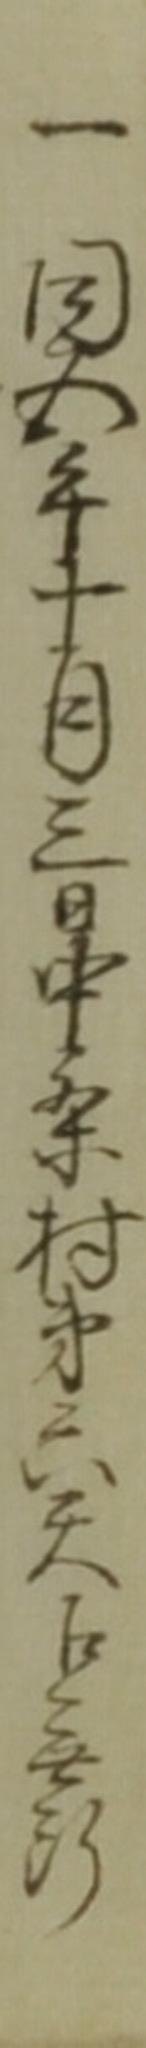一同五午十月三日中条村第六天江無断
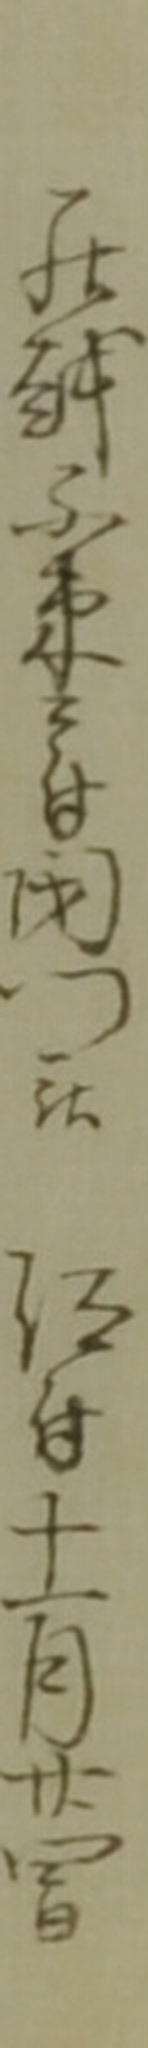罷越不束ニ付閉門被仰付十一月廿四日
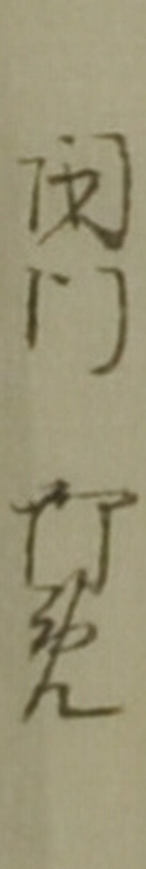閉門御免
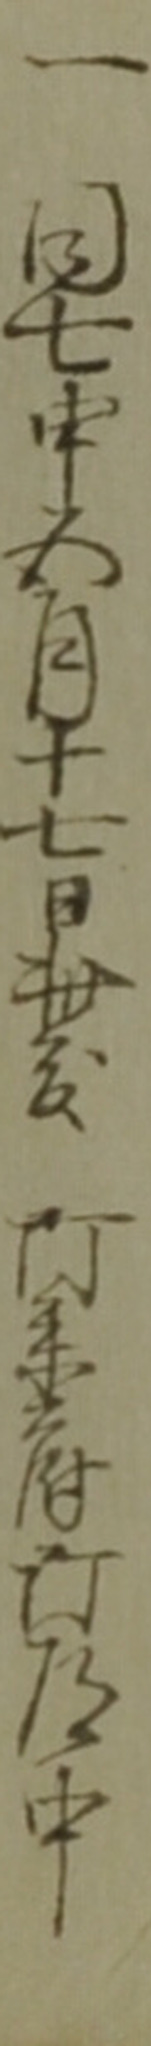一同七申五月十七日此度御参府御道中
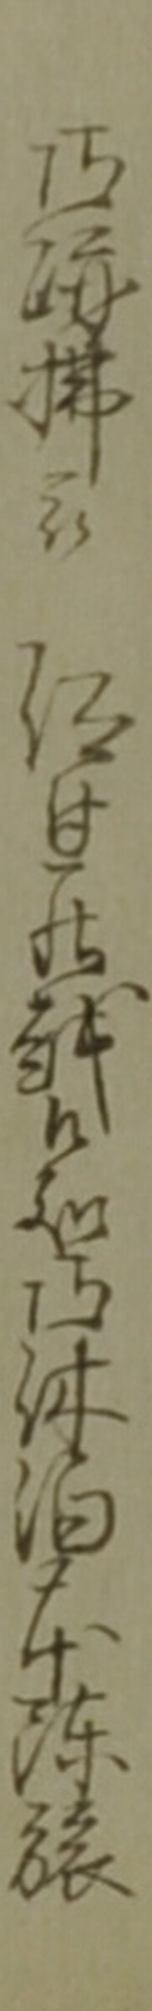御跡払被仰付罷越候処御休泊本陣旅
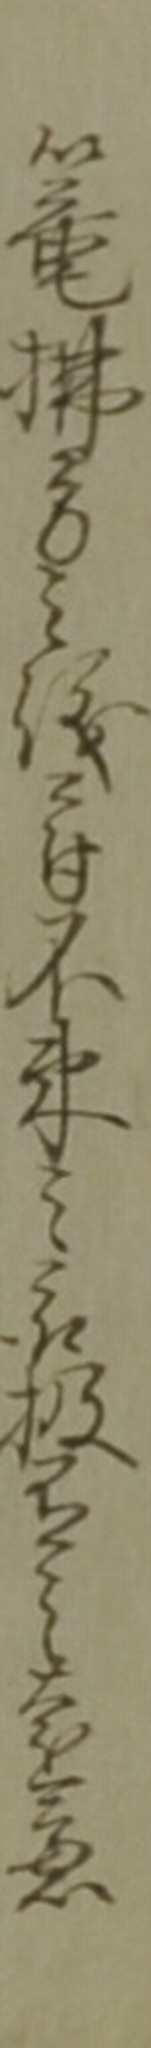籠払方之儀不束之取扱有之遠慮
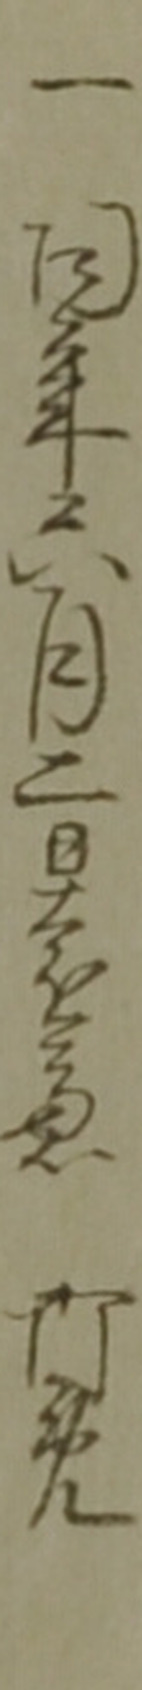一同年六月二日遠慮御免
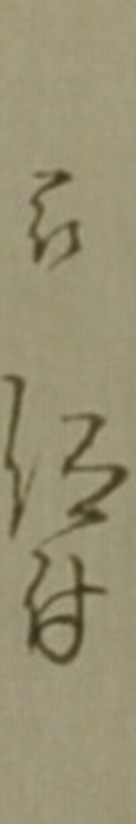被仰付
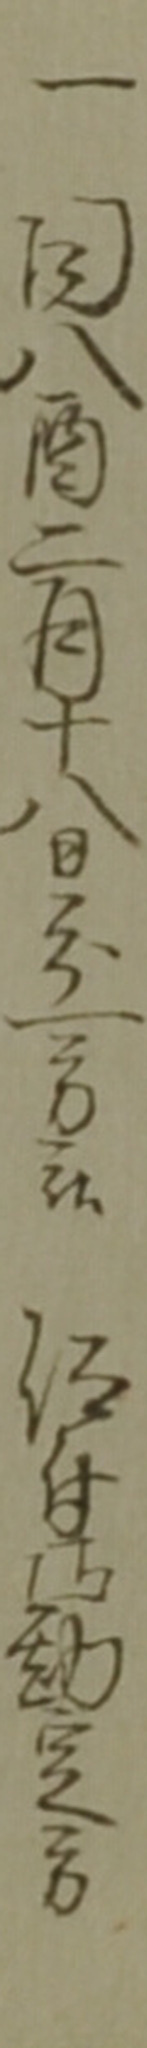一同八酉二月十八日分一方被仰付御勘定方
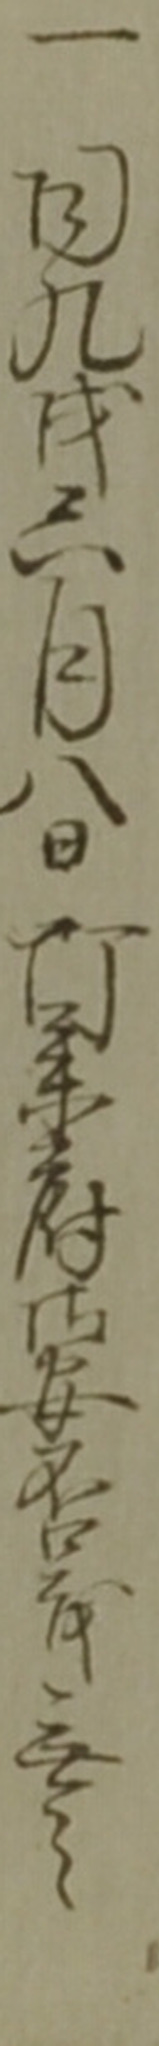一同九戌六月八日御参府御安否茂無之
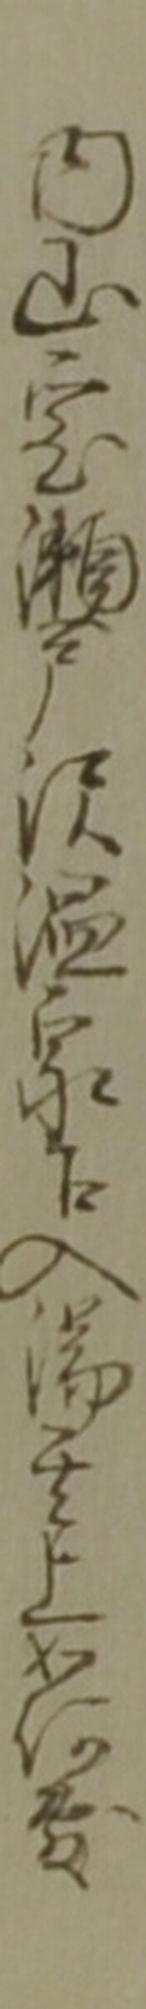内山室瀬戸沢温泉江入湯其上如何敷
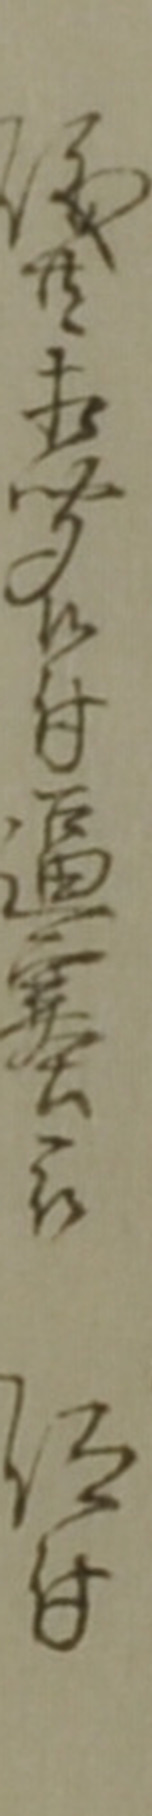儀共相聞候付逼塞被仰付
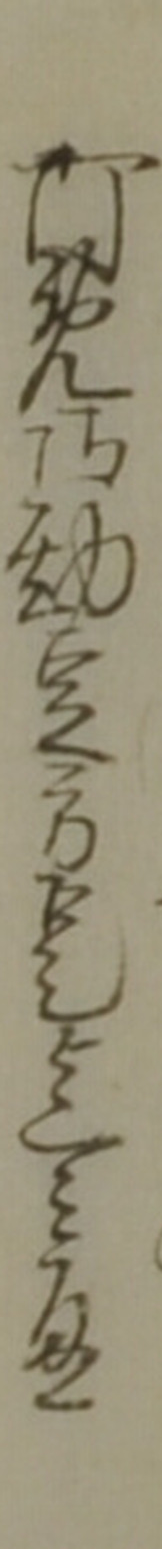御免御勘定方是迄之通
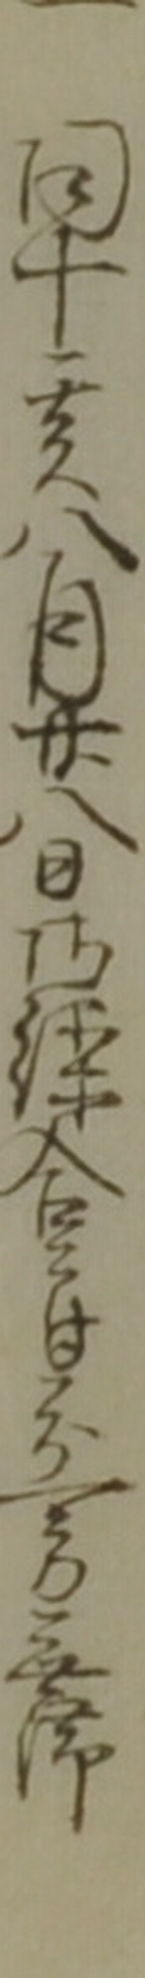一同十亥八月廿八日御繰合ニ付分一方無滞
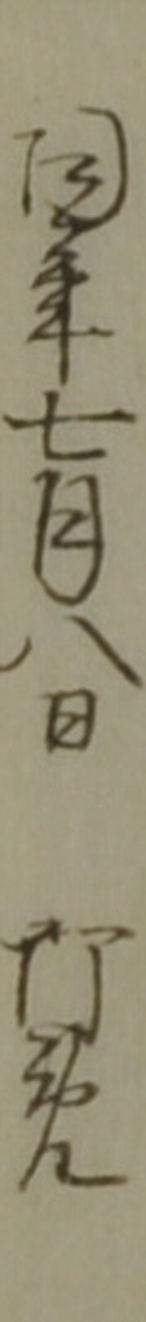一同年七月八日御免
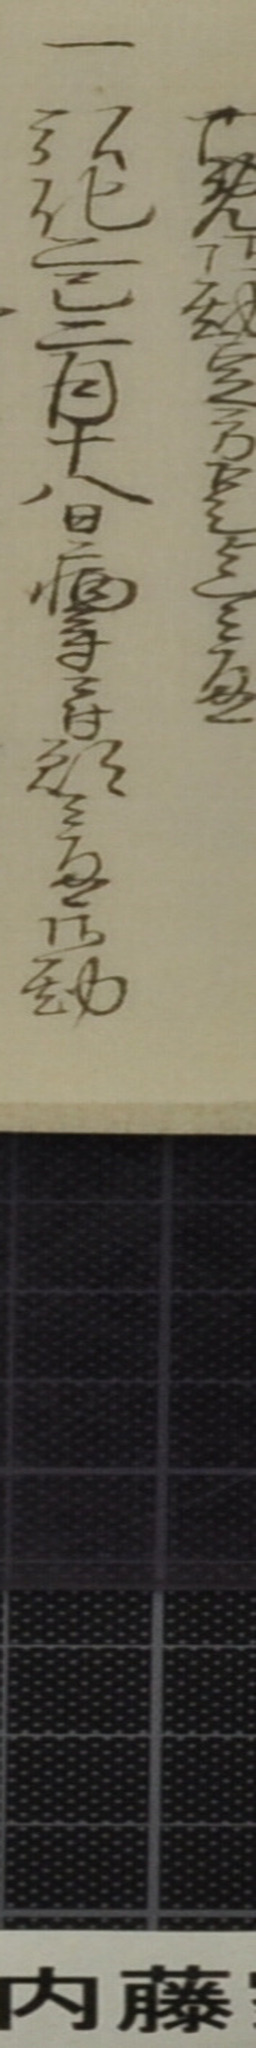一弘化二巳二月十八日病気ニ付願之通御勘
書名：無足廃家（壱）
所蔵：伊那市立高遠町図書館・合同会社AMANE
